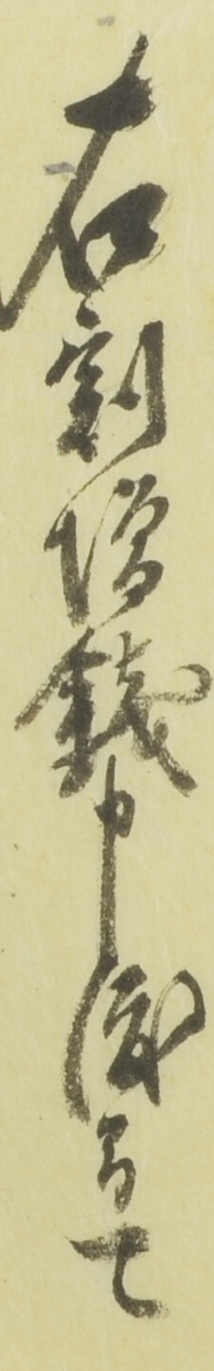右割増銭申渡候而可
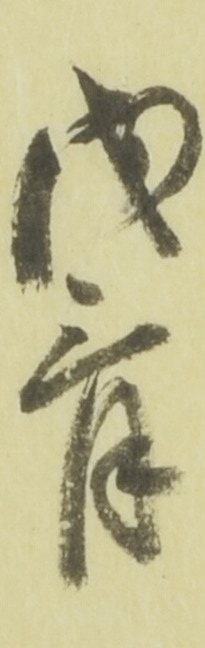戌三月
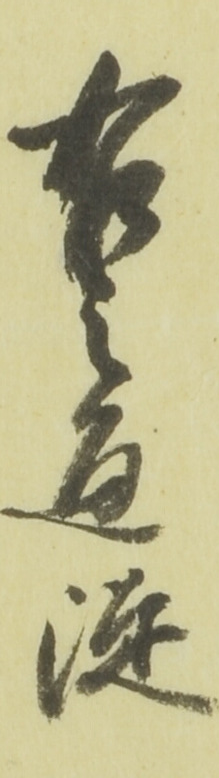右之通従
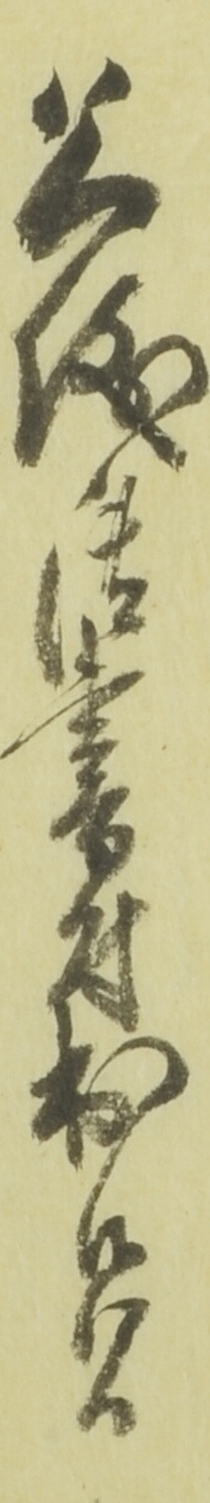公儀御書付出候間
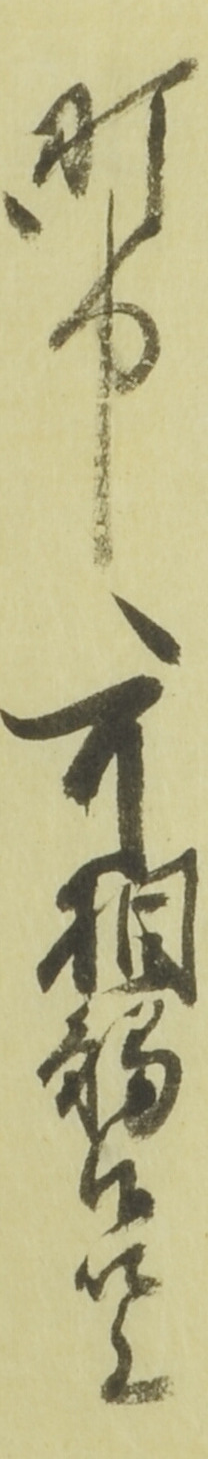町中へ可相触候以上
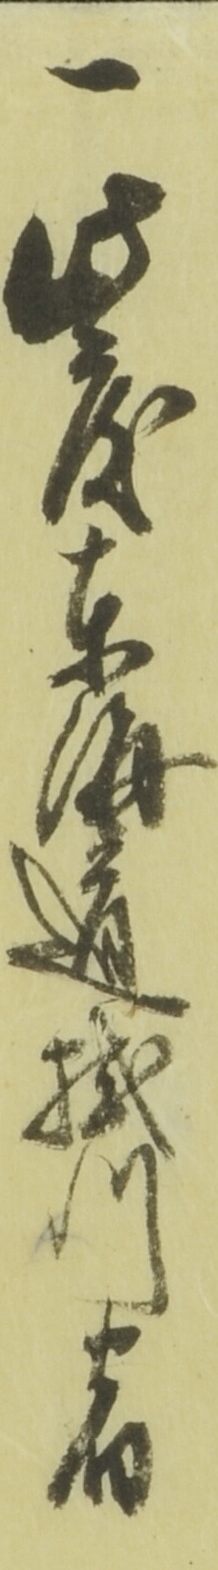一此度東海道掛川宿
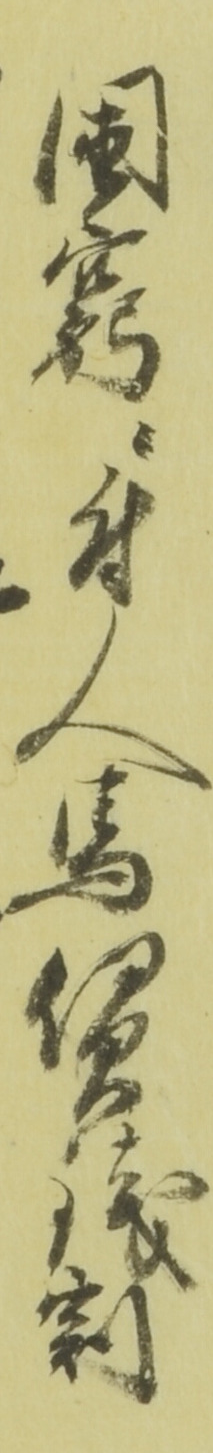困窮ニ付人馬賃銭割
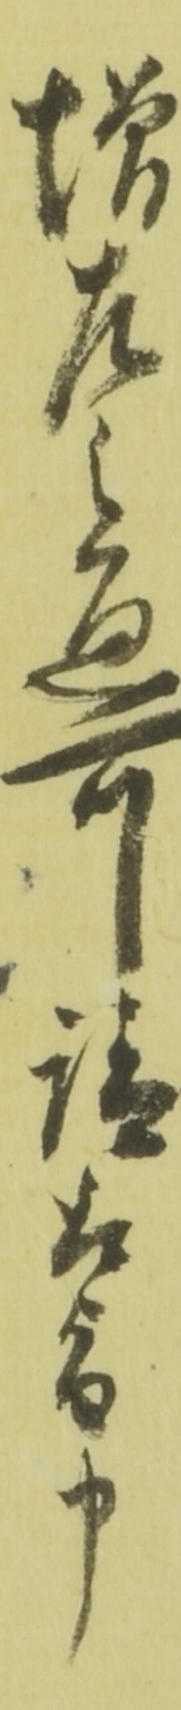増左之通可請取旨申
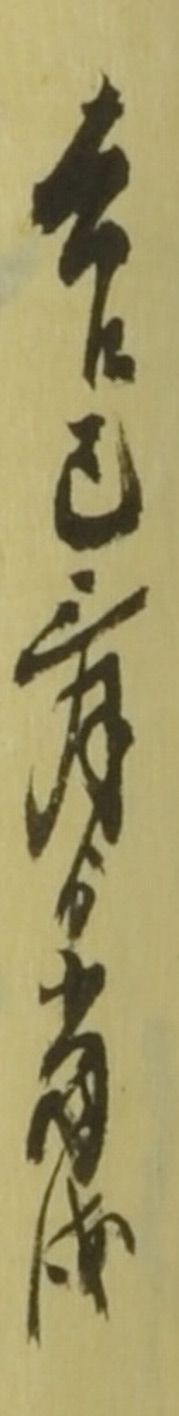去ル巳三月ゟ当戌
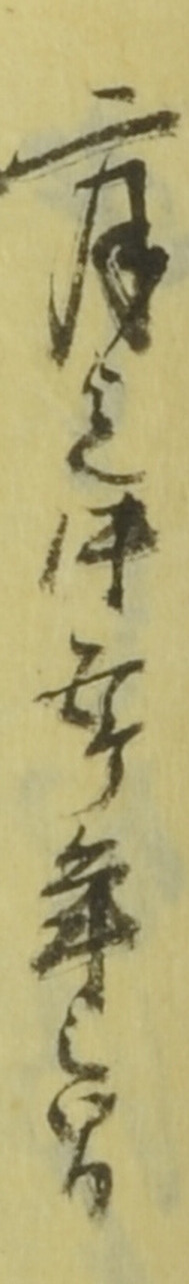卯二月迄中五ヶ年之間

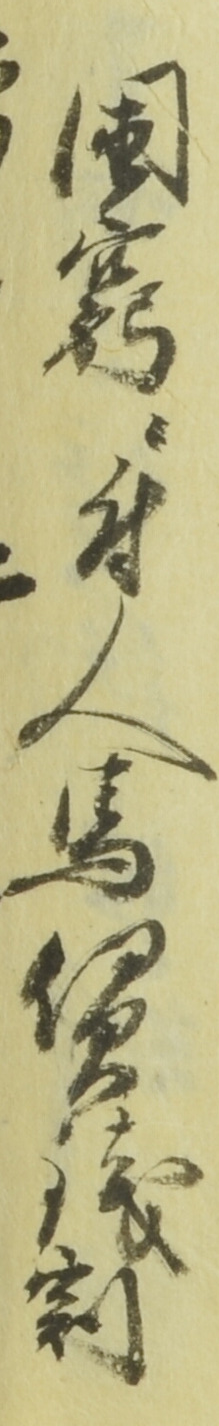困窮ニ付人馬賃銭割
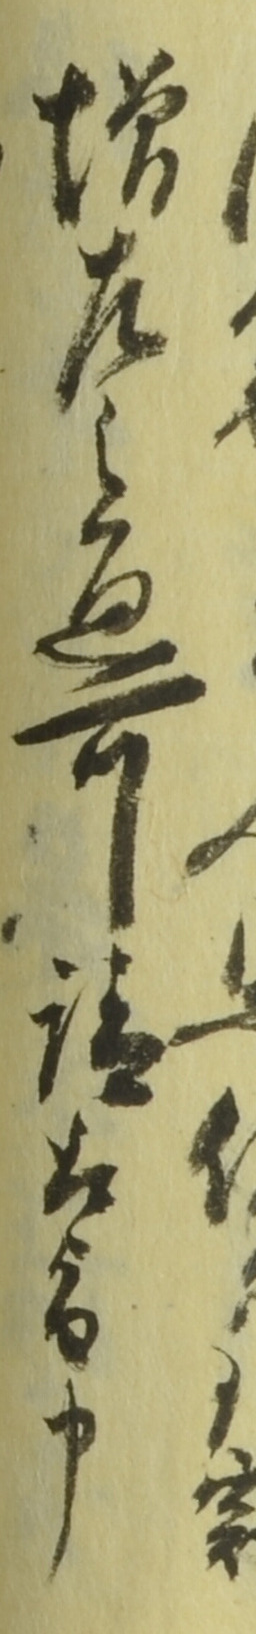増左之通可請取旨申
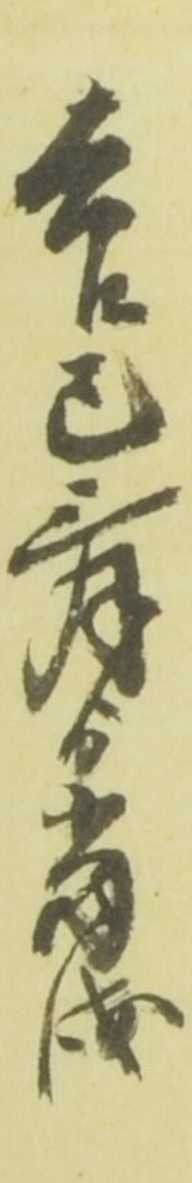去ル巳三月ゟ当戌
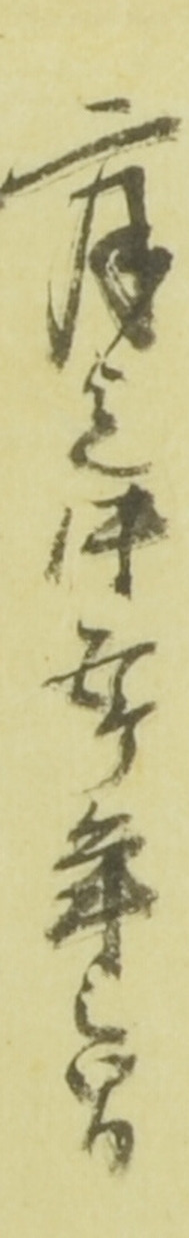二月迄五ヶ年之間
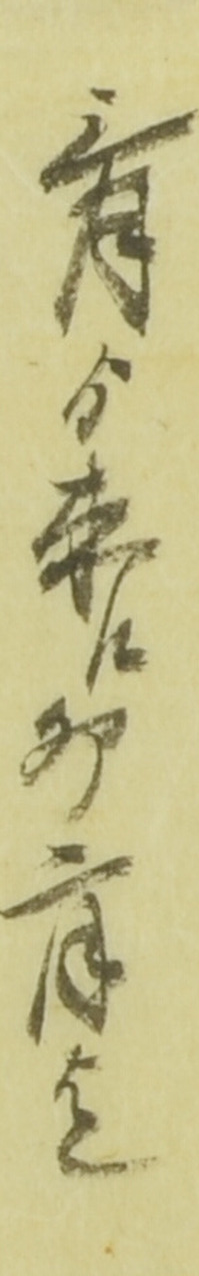三月ゟ来ル卯二月迄
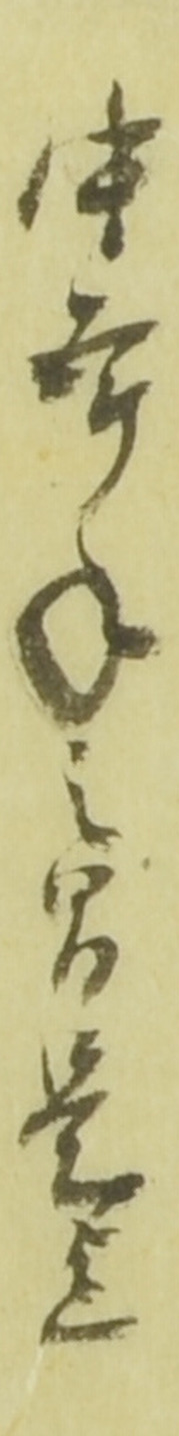中五ヶ年之間是迄
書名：御触書御書附控
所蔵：伊那市立高遠町図書館・合同会社AMANE
